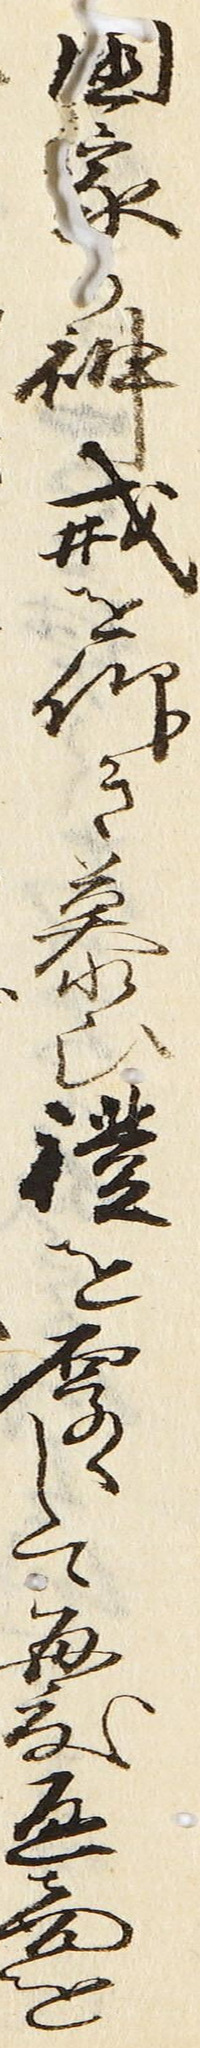国家の神戒を仰き慕ひ礼を厚くして毎度通商を
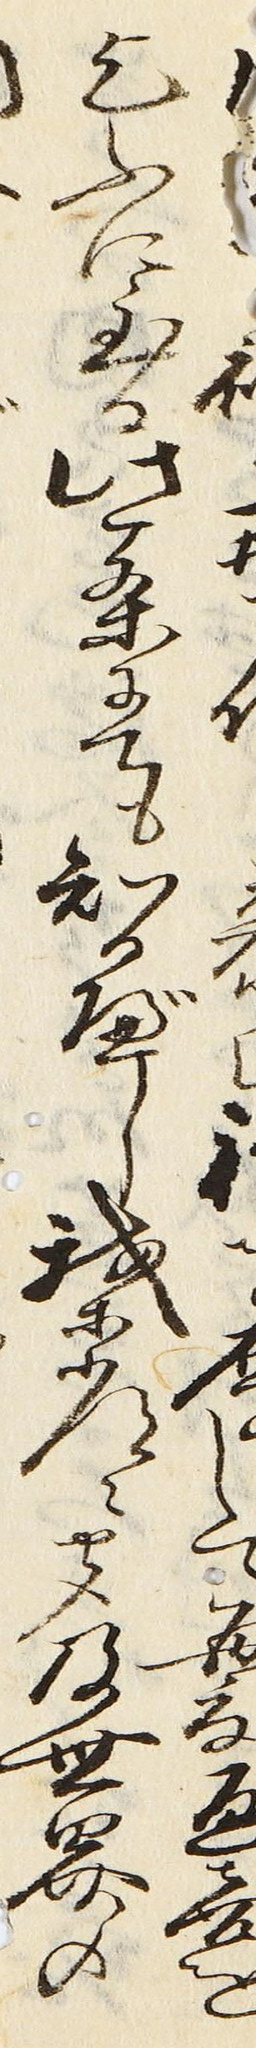乞ふに至る此ケ条にても知るべし我等常々聞及世界の
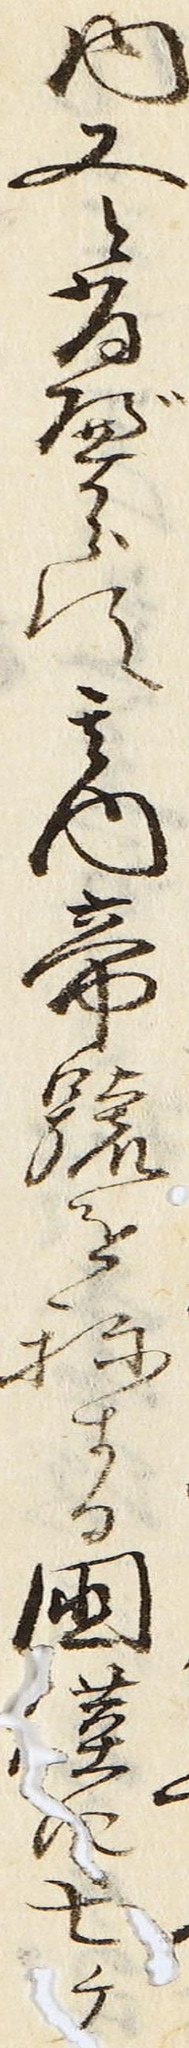内又と有べからす其内帝号を称する国僅に七ケ
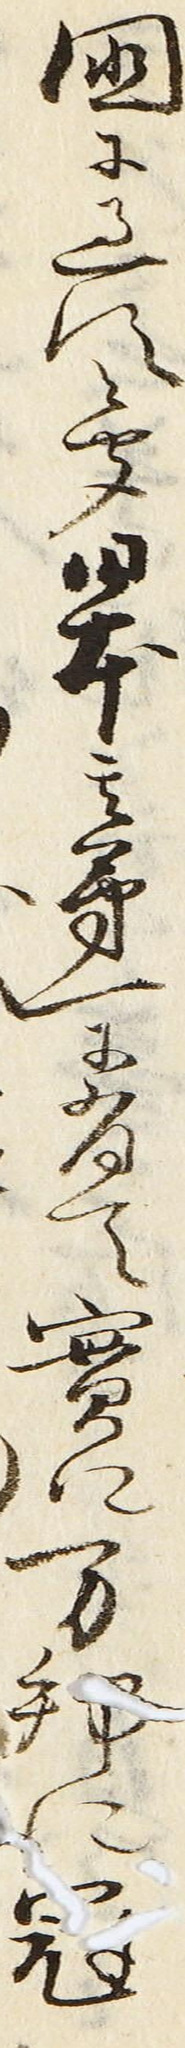国に過すと聞日本其第一に有て実に万邦に冠
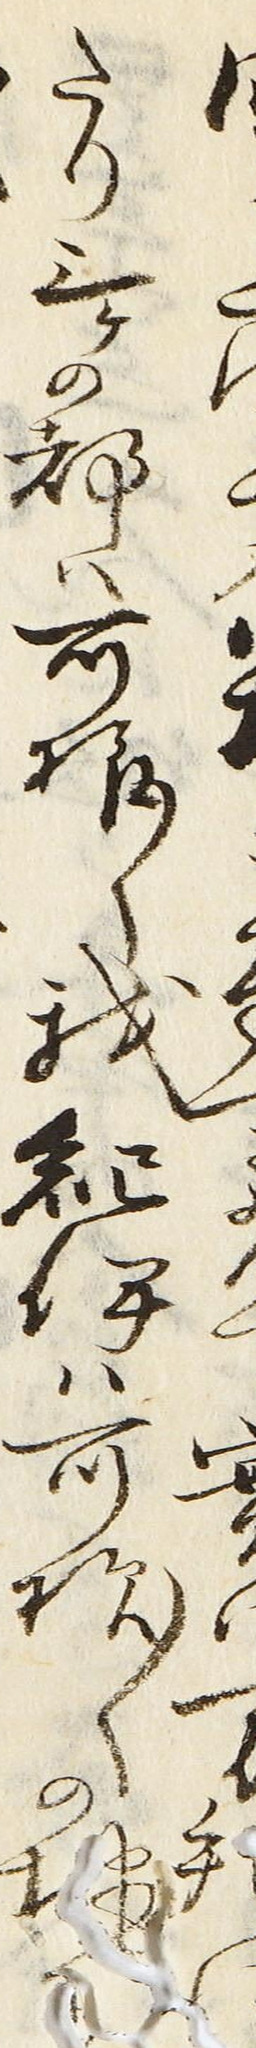たり三ケの都ハ所様〳〵我紀伊ハ所様〳〵の地
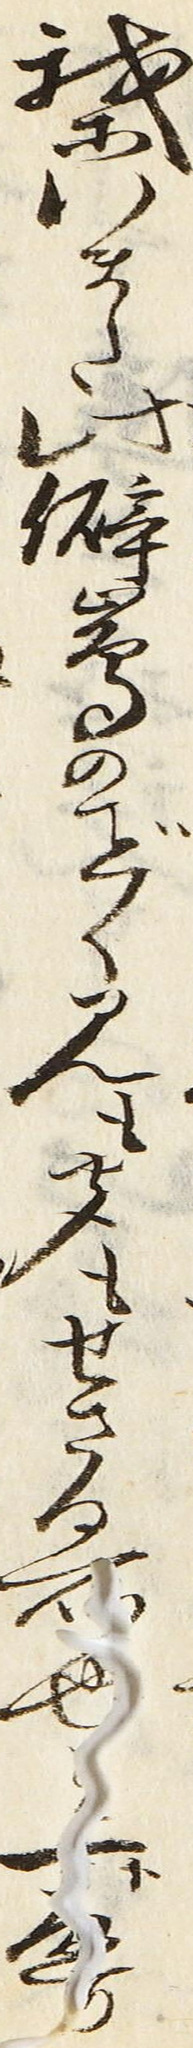我等いまた此僻島のごとく見も聞もせさる所也一ト通り
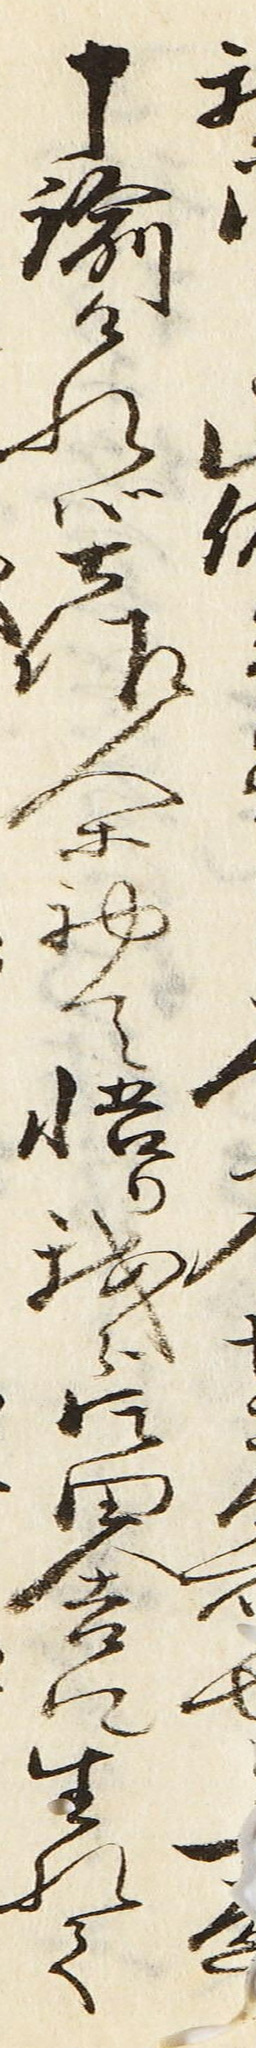申諭けれバ土佐人等初て悟り我ら片田舎に生れて
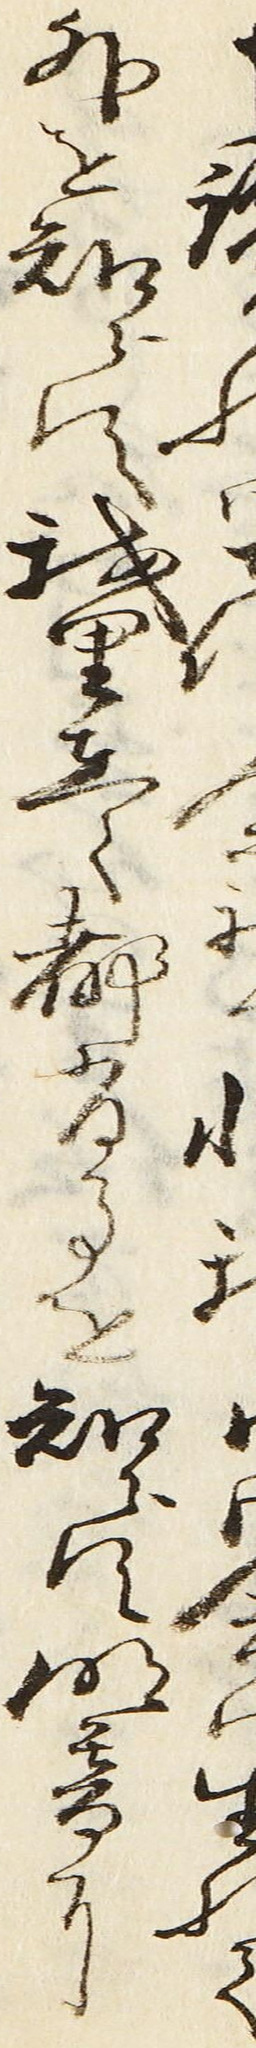外を知らす我里在て都有事を知らす明暮に
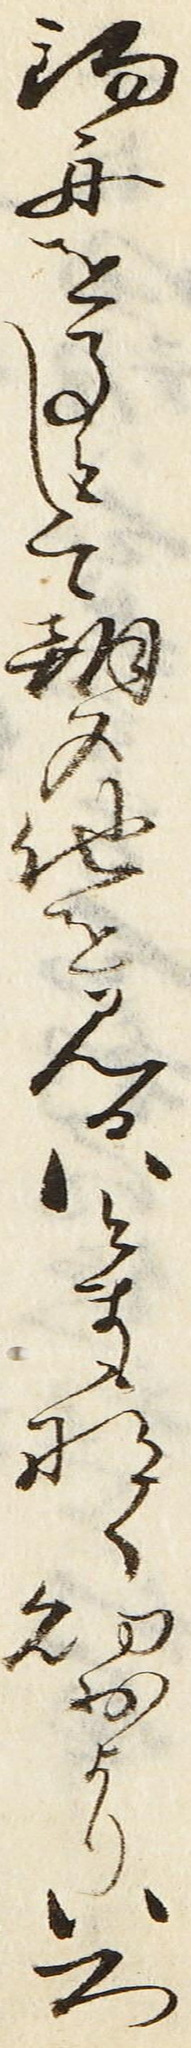釣舟を事として朝夕他を見るいとまなく幼少よりいろ
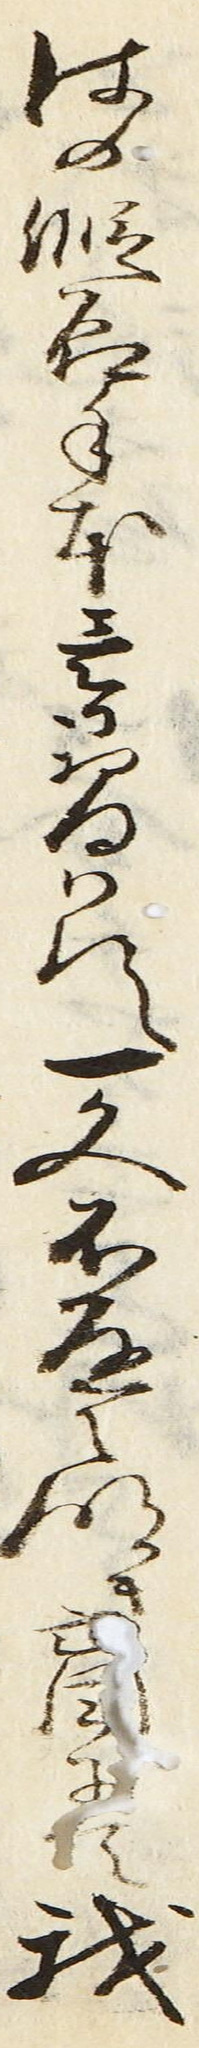はの假名手本壱ツ習ハす一文不通之明キ盲にて我
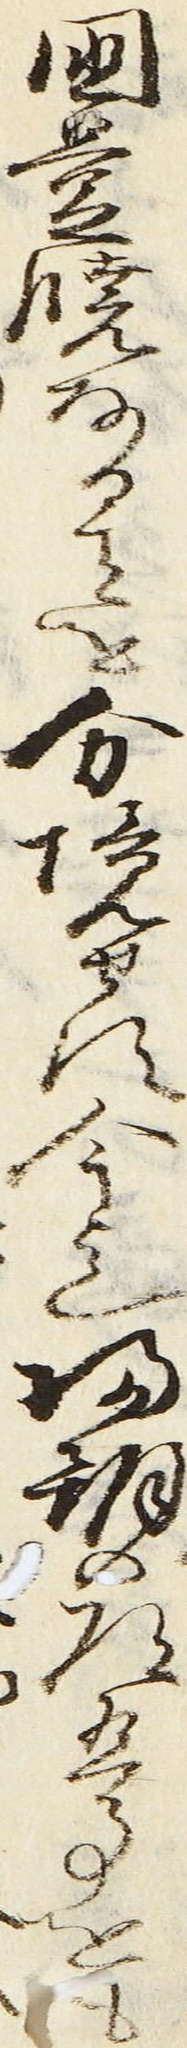国豊饒なることを分境せす今迄帰朝の道有事をも
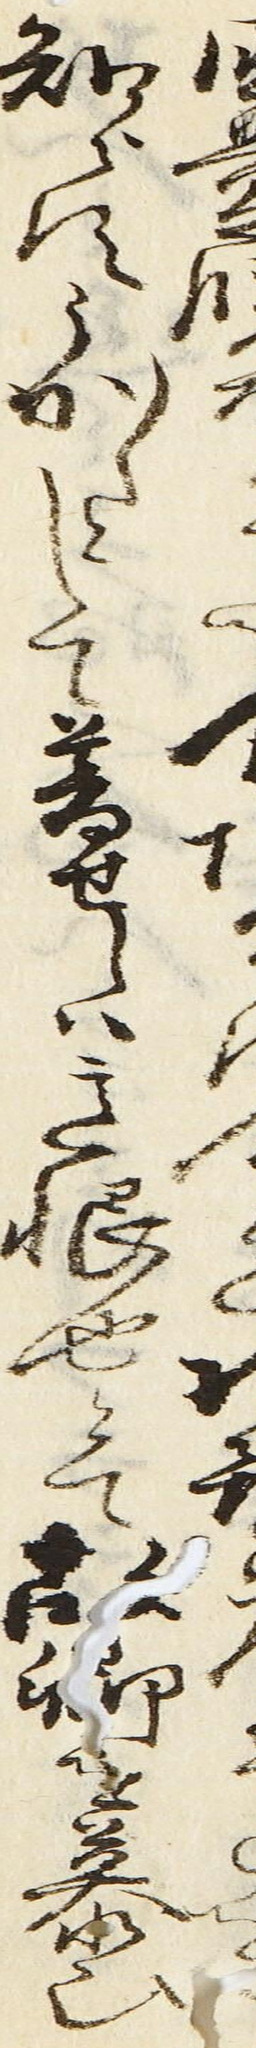知らすうか〳〵として暮せしハ意恨也とて故郷を慕ひ
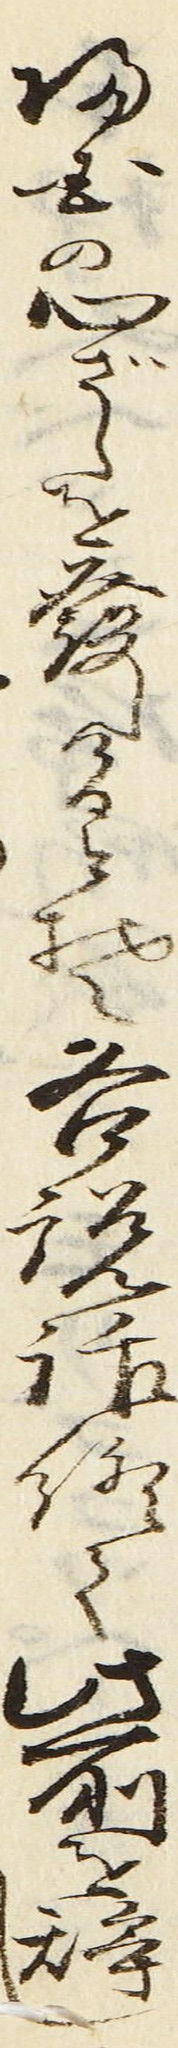帰国の心ざしを発しけるとそ各説話終て此所を辞し
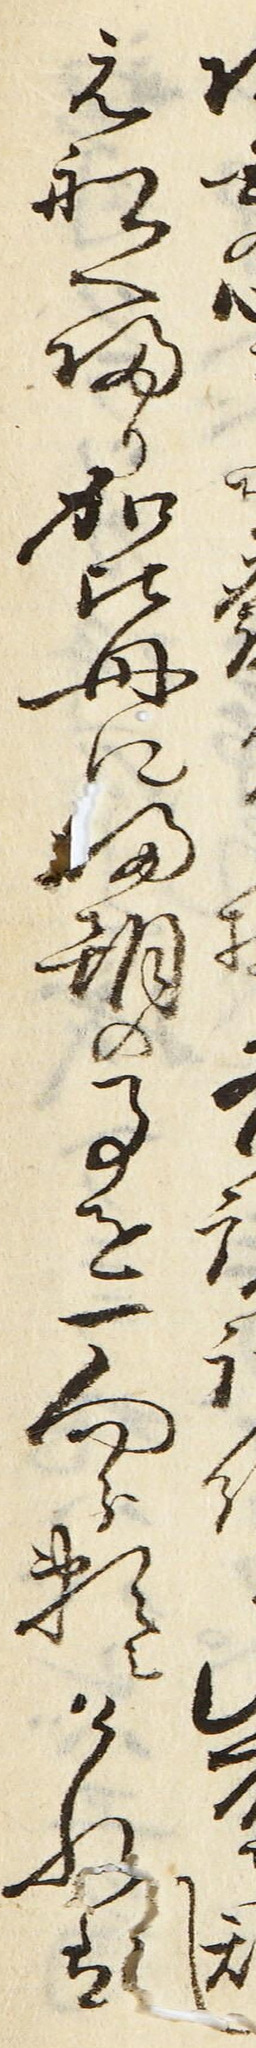元船へ帰り加比丹に帰朝の事を一向ら頼ミけれは

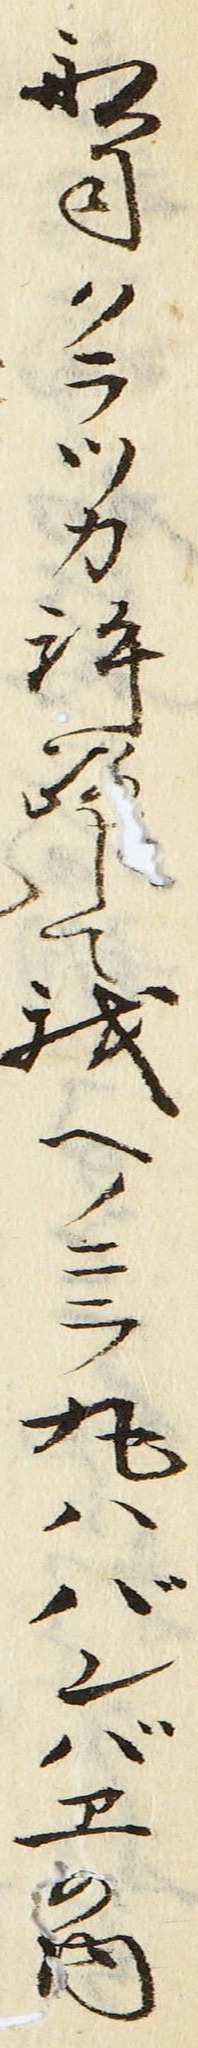船司クラツカして我へノニラ丸ハバンバエの内
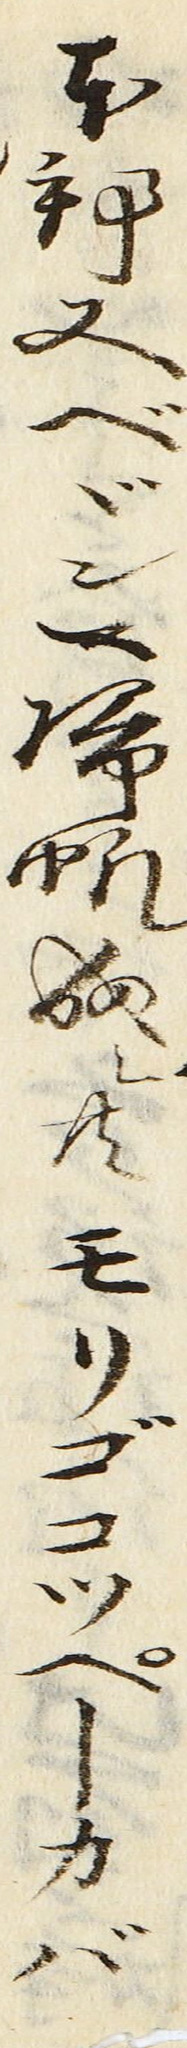本邦ヌベヾンへ帰帆成レ共モリゴコツペーカバ
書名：亜墨利加漂流記聞
